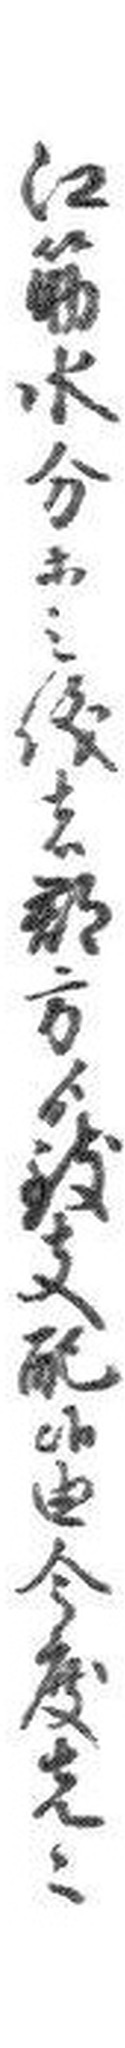江筋水分等之儀者郡方ゟ致支配候由今度先々
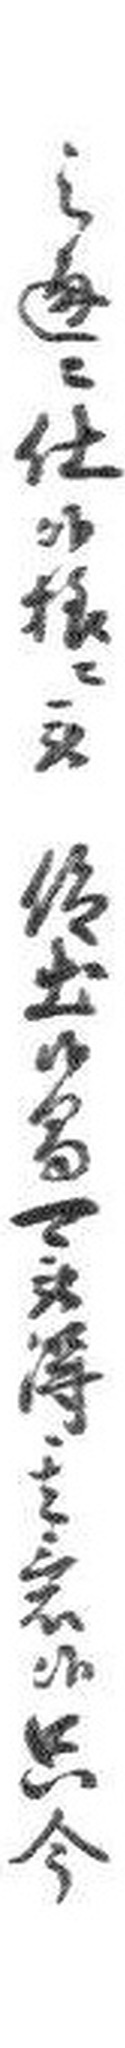之通ニ仕候様ニ被仰出候間被得其意候只今

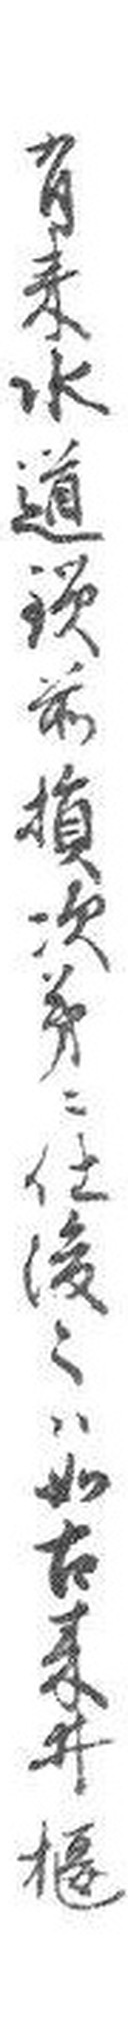有来水道鎖前損次第ニ仕後々ハ如古来井堰
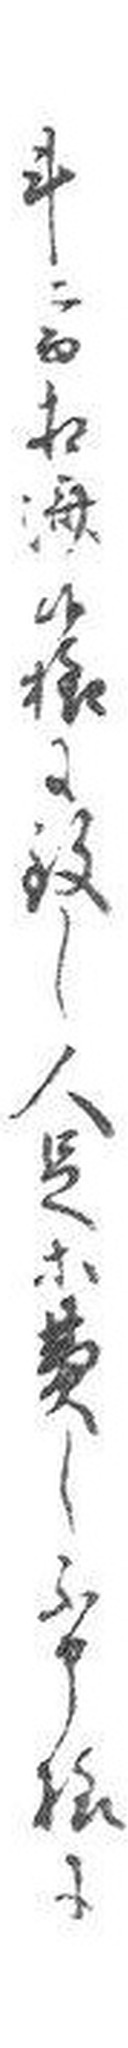計ニ而相済候様に致し人足等費し不申様に
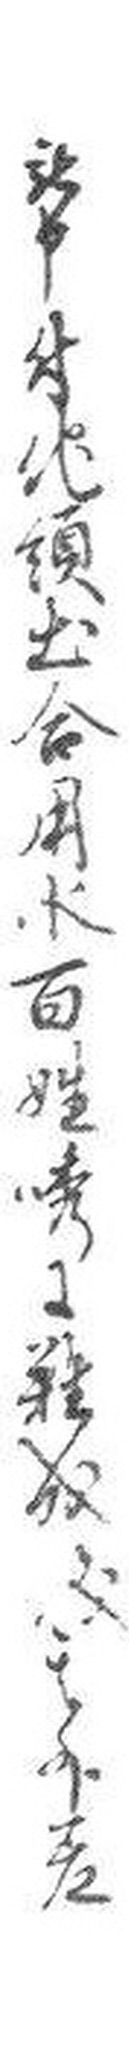被申付他領出合用水百姓誘に難成儀其外差
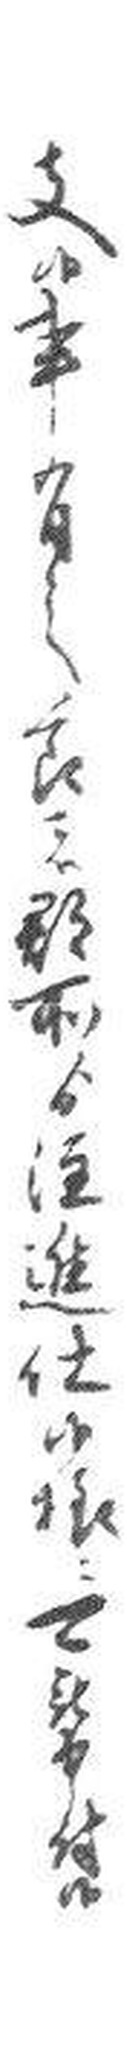支候事有之節者郡所ゟ注進仕候様ニ可被申付候
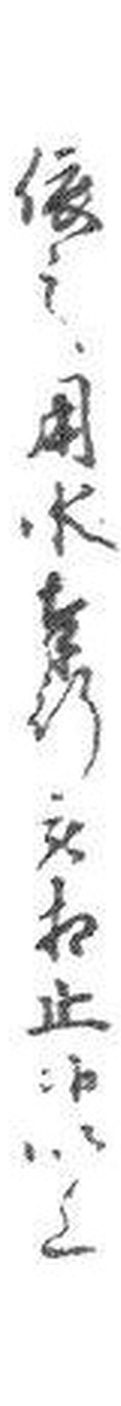依之用水奉行被相止候以上
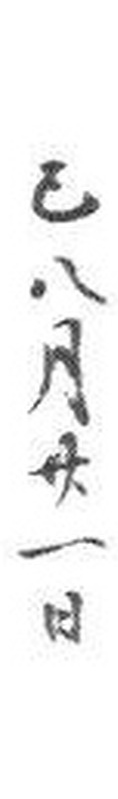巳八月廿一日
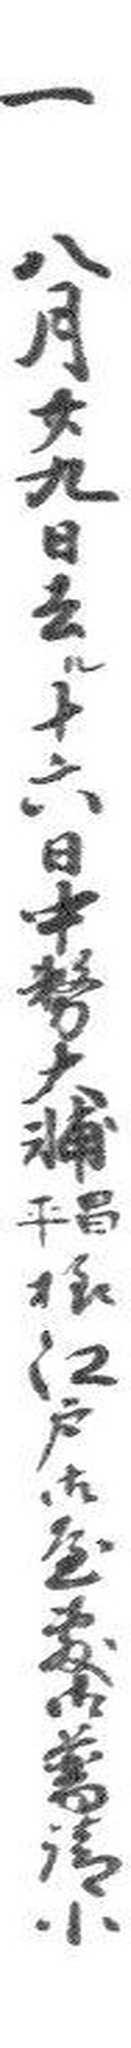一八月廿九日去ル十六日中務大輔昌平様江戸御屋敷御普請小
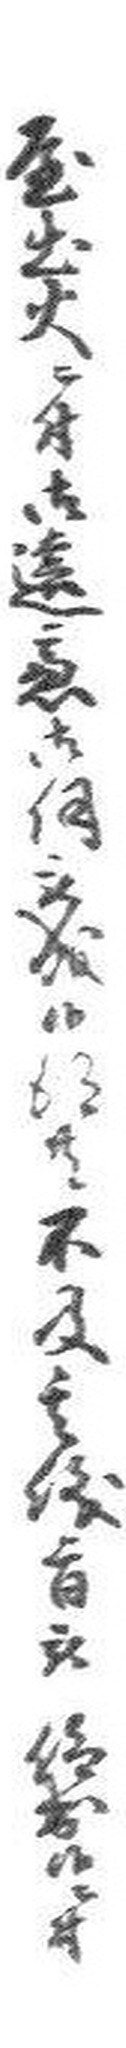屋出火ニ付御遠慮御伺被成候得共不及其儀旨被仰出候ニ付
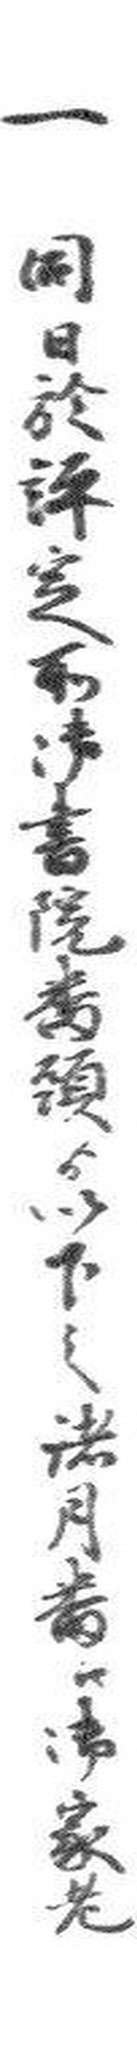一同日於評定所御書院番頭ゟ以下之諸月番江御家老
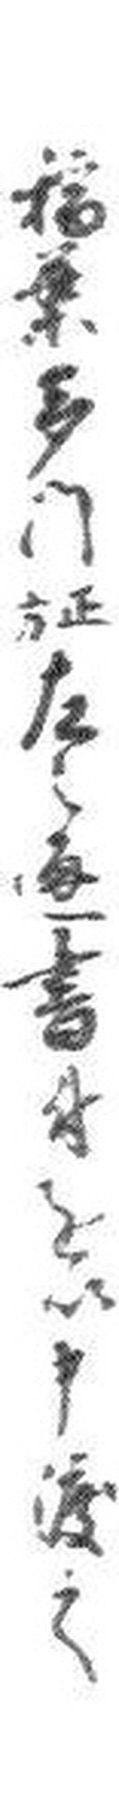稲葉多門正方左之通書付を以申渡之
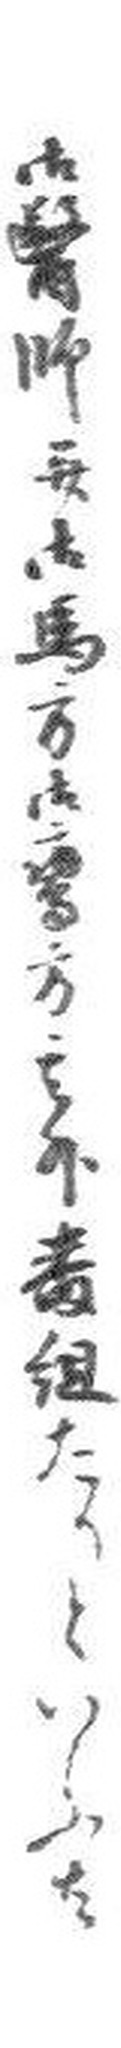御医師并御馬方御鷹方其外番組たりといふ共
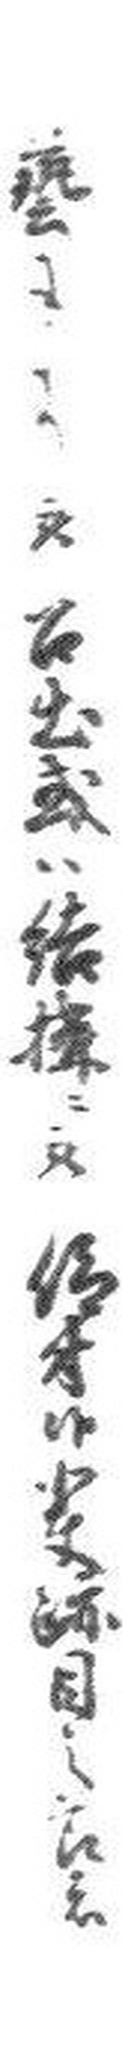芸により被召出或ハ結構ニ被仰付候輩跡目之節者
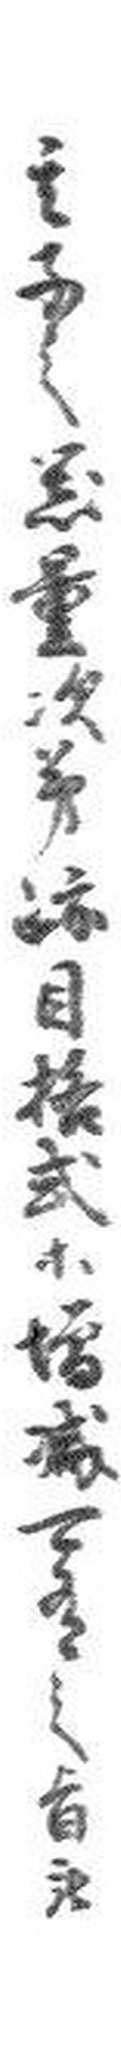其子之器量次第跡目格式等増減可有之旨被
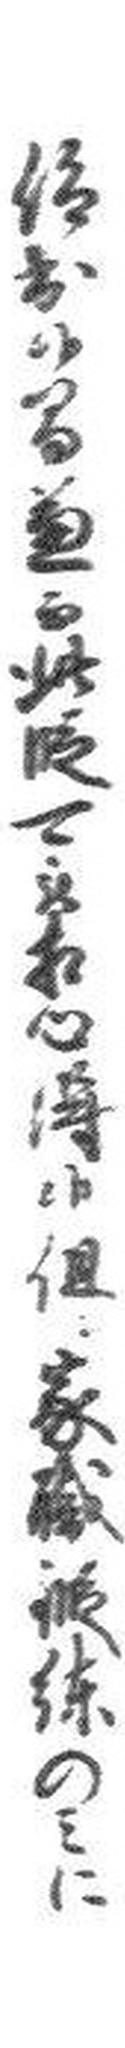仰出候間兼而此段可被相心得候但シ家職鍛錬のミに
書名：家譜 二十九 吉邦公 従正徳二年到正徳三年
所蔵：福井県文書館 Fukui Prefectural Archives
